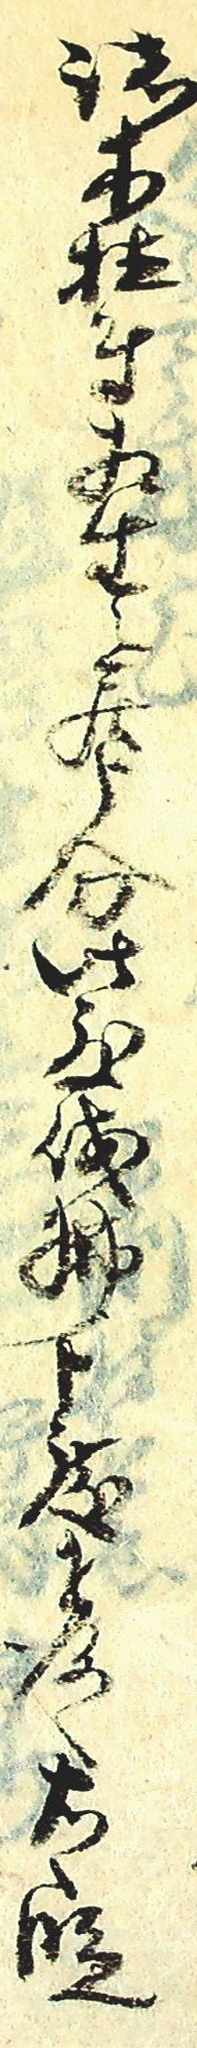諸木植付相生し居申分此度伐払申度奉存候右之段
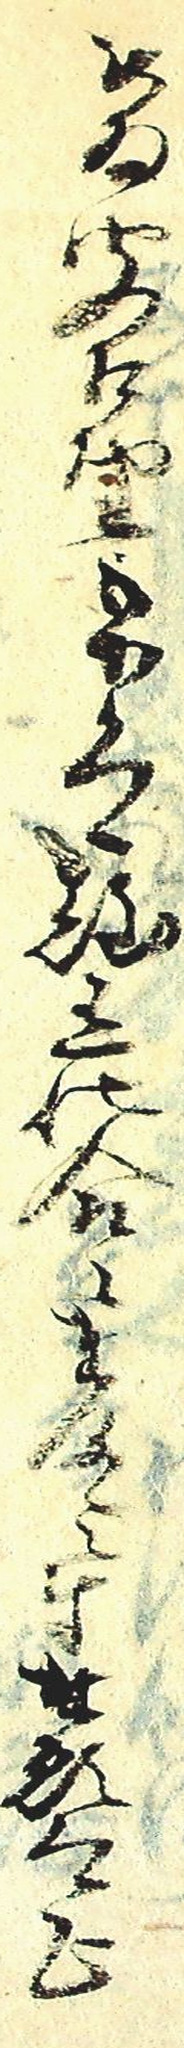被為聞召届被下候はゝ難有仕合に奉存候に付奉願上候以上
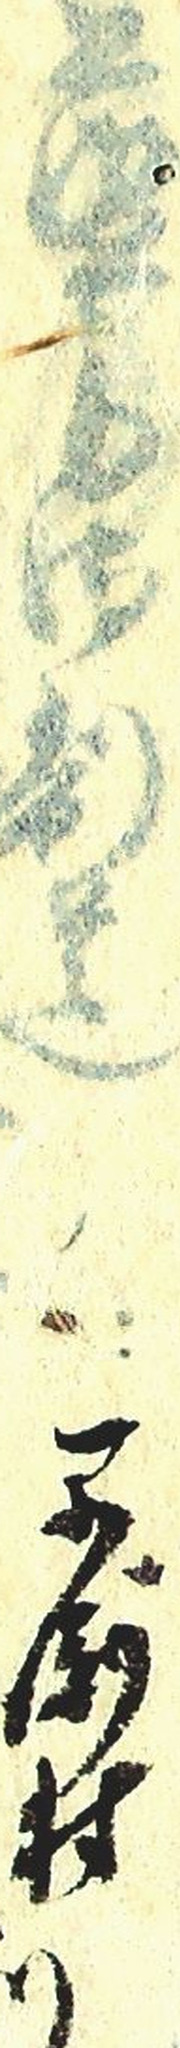早渕村
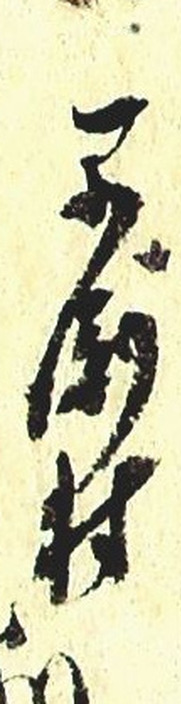早渕村
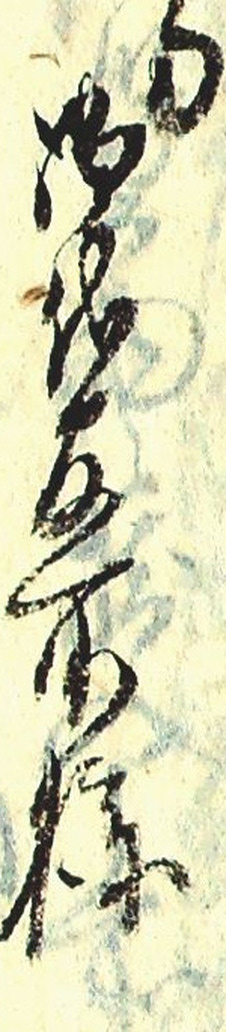御代官所様
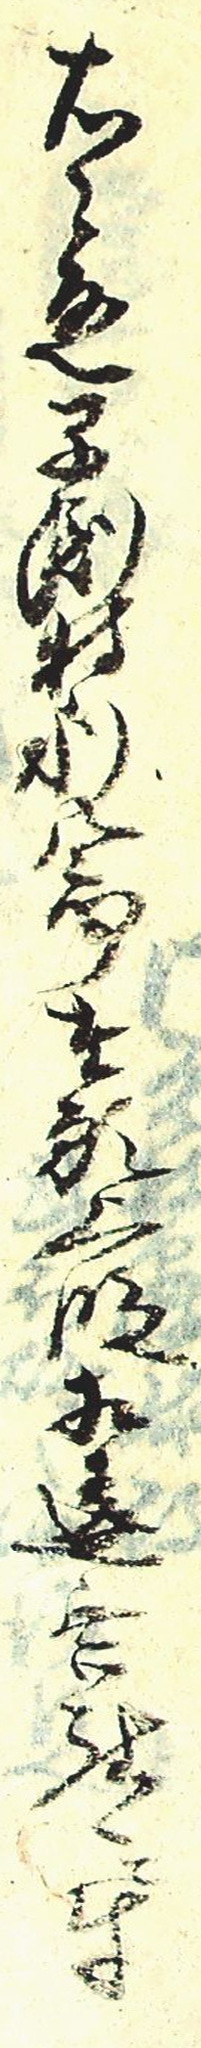右之通早淵村利八郎奉願上段相違無御座候に付
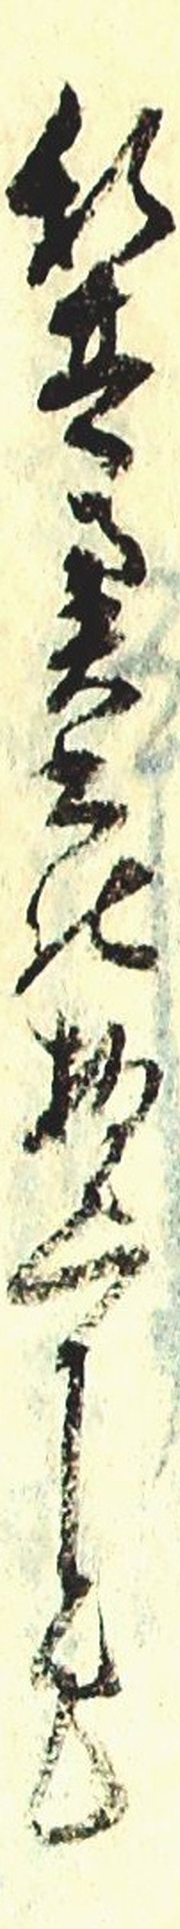私共奥書仕指上申候以上

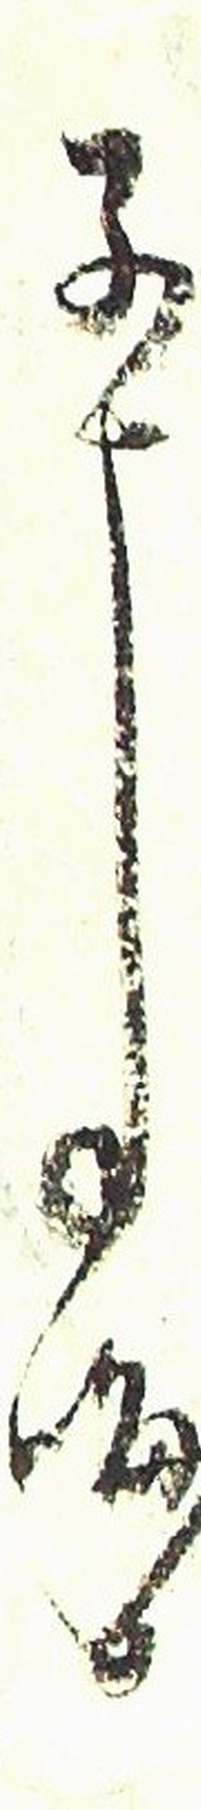子十月金蔵
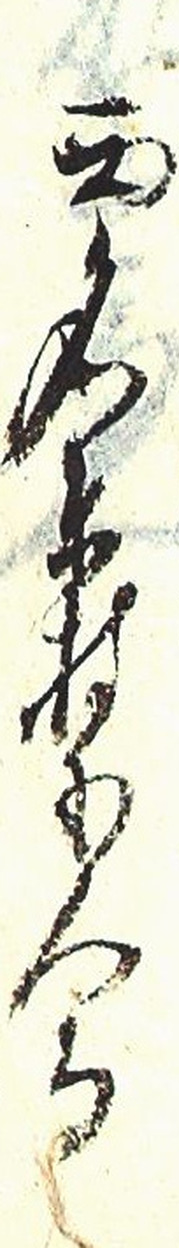西名東村五人与
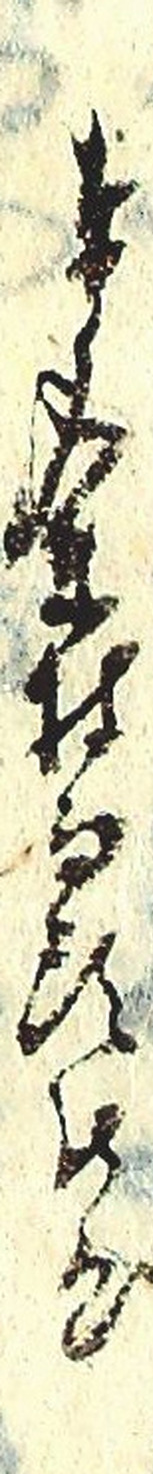東名東村与頭庄屋
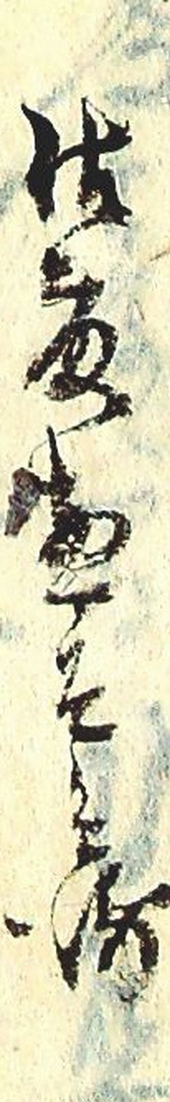佐藤惣太兵衛
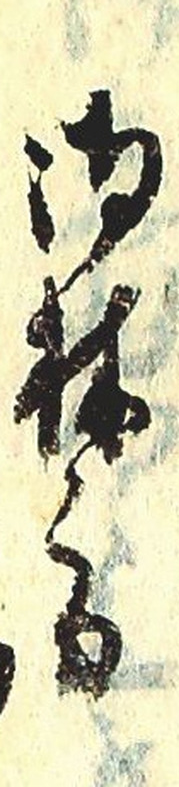御林方
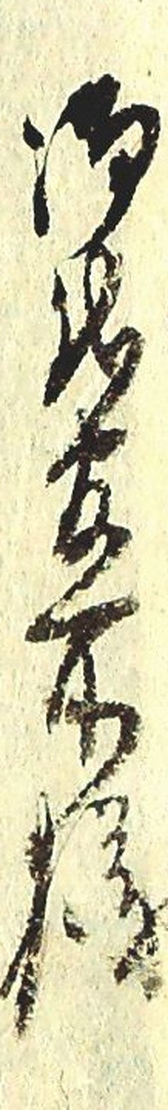御代官所様
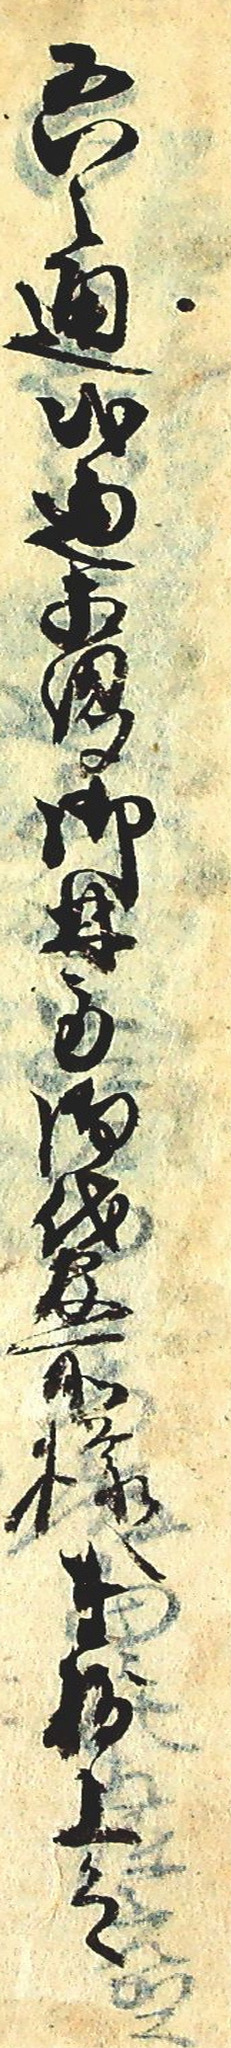右之通弐通相認め御林方御代官所様へ奉指上候はゝ
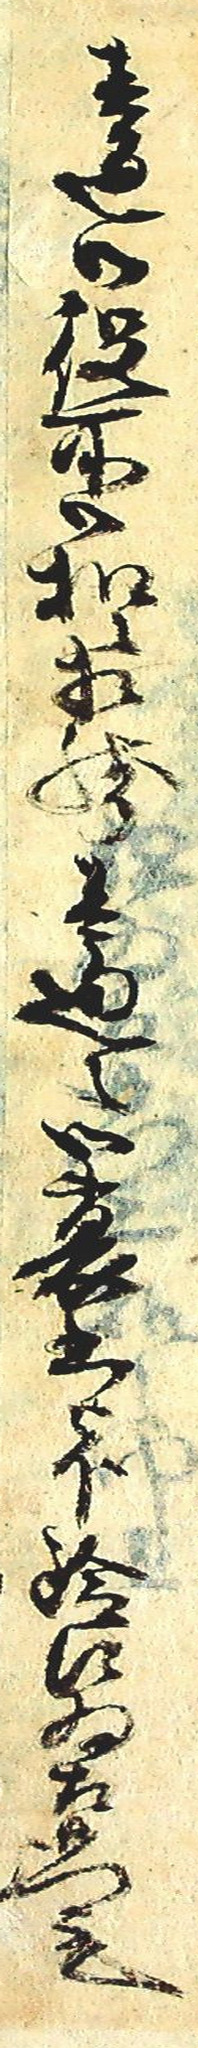壱通御役所御扣に相残り壱通に御裏書被下鈴江為左衛門殿
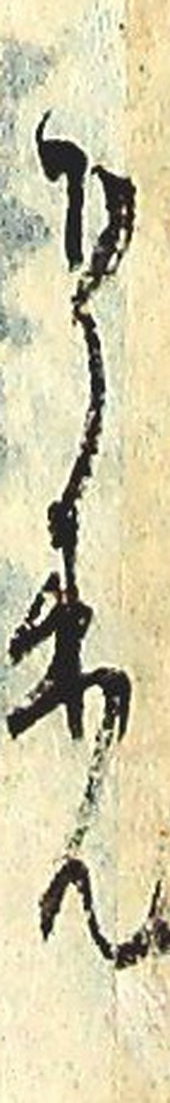下り来る
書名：諸御願書控(弐番）
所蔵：鳴門教育大学 Naruto University of Education
